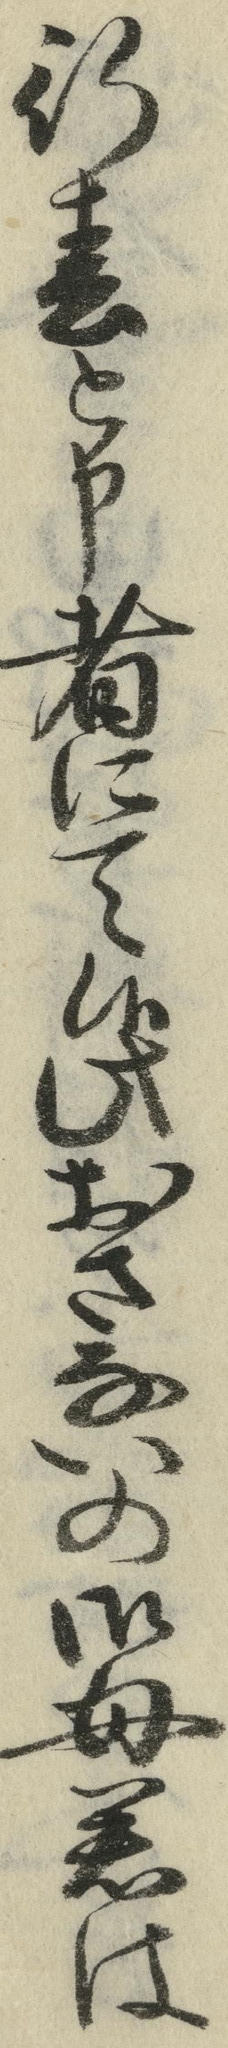行春と申者にて候此おさないの御母君は
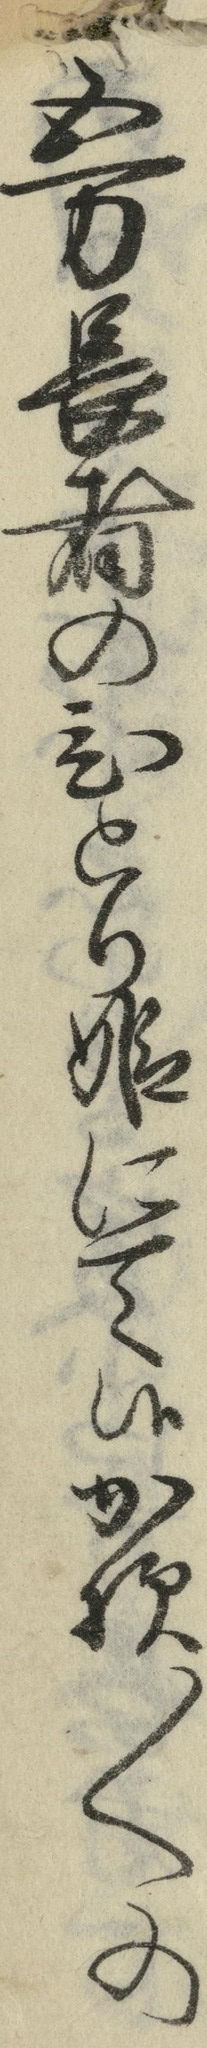五万長者のひとり姫にて候か様〳〵の
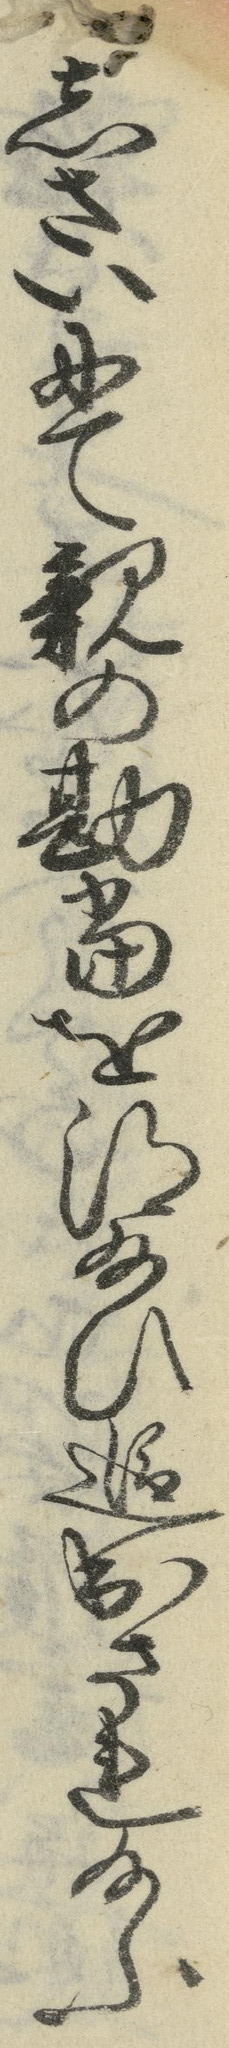しさいにて親の勘当を得給ひ追出され給ふ
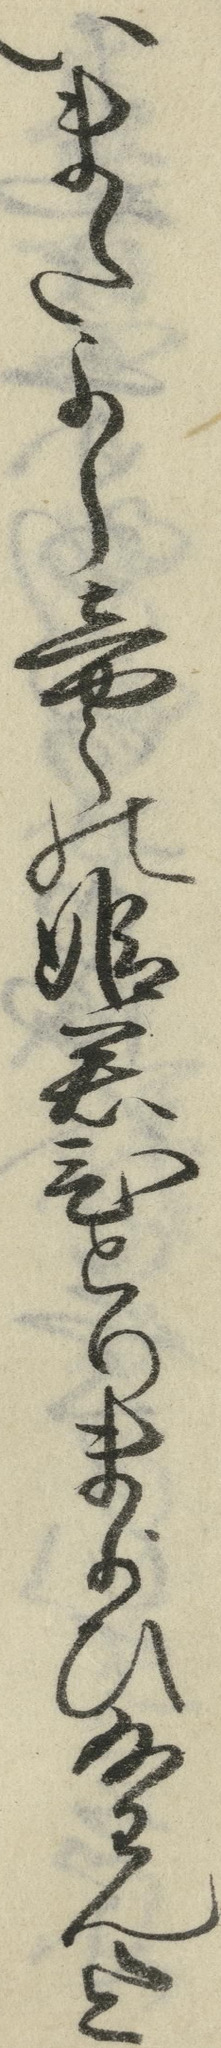いまたようしやうの姫君ひとりまよひ給わんこと
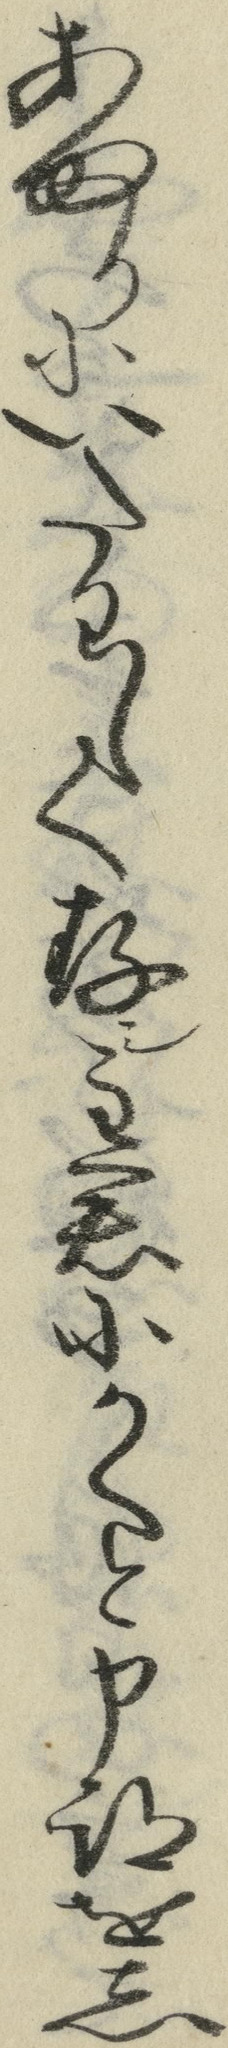あまりにいたわしく存主君にかくと申跡をし
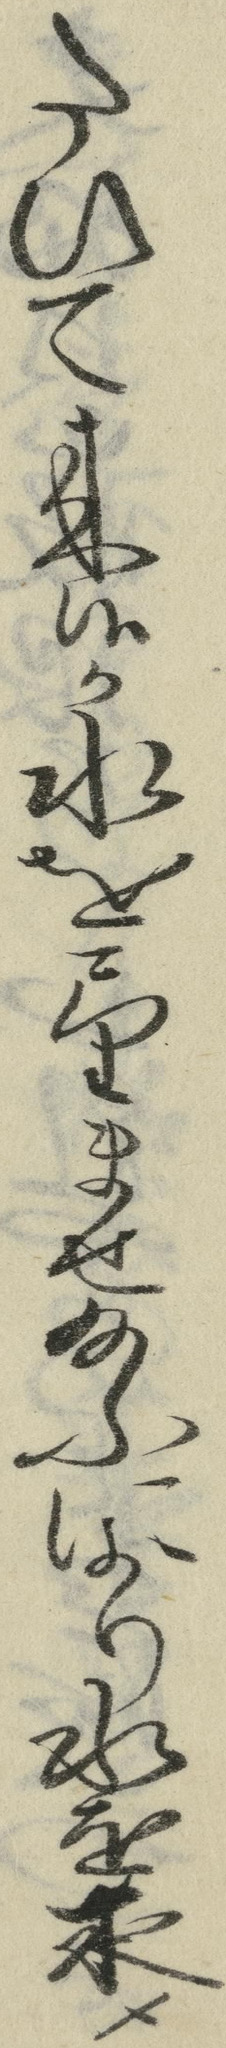たひて来候か水を望ませ給ふにより水を求メ
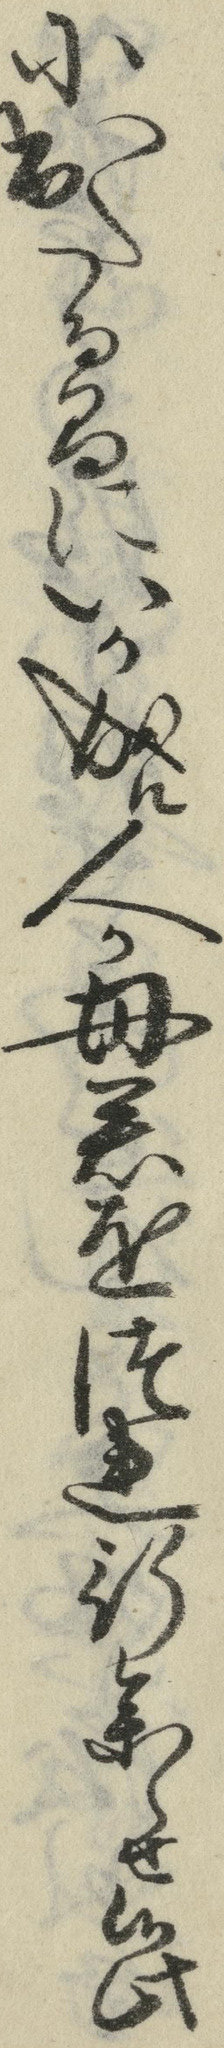に出たる間にいか成人か母君をつれ行参らせ候此
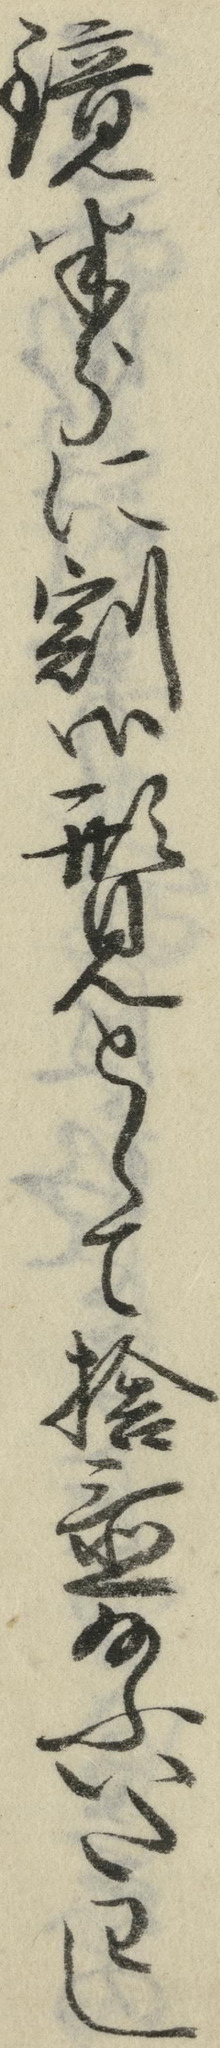鏡半分に割御形見として捨置給ふいたわし
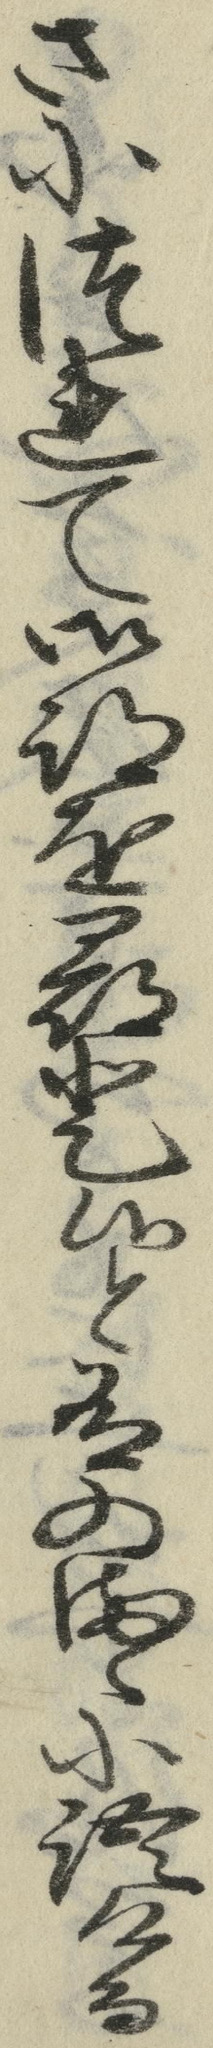さにつれて御跡を尋登候と有のまゝに語ける
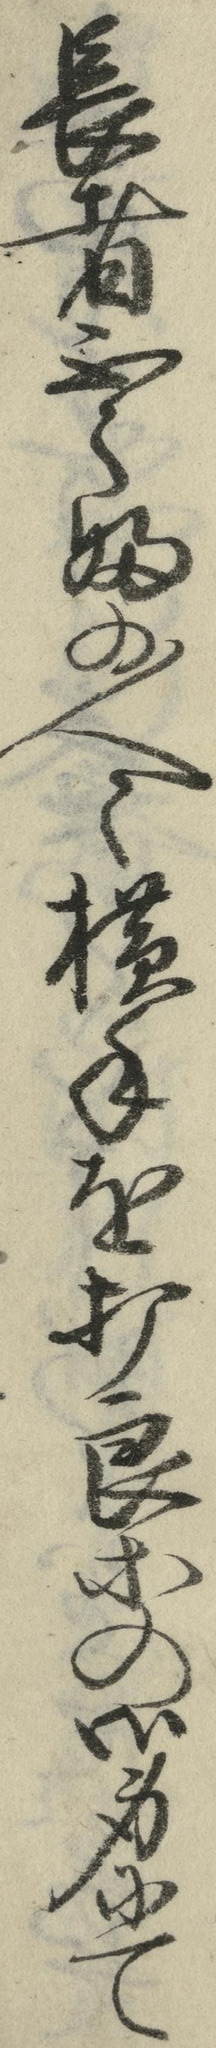長者ふうふの人ゝ横手を打良等の御身にて
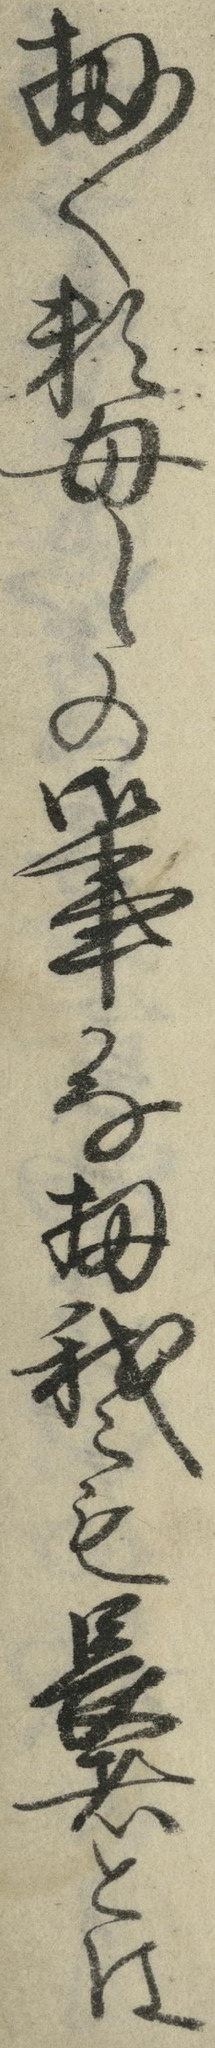扨〳〵頼母しの御事かな扨我らも長者とは

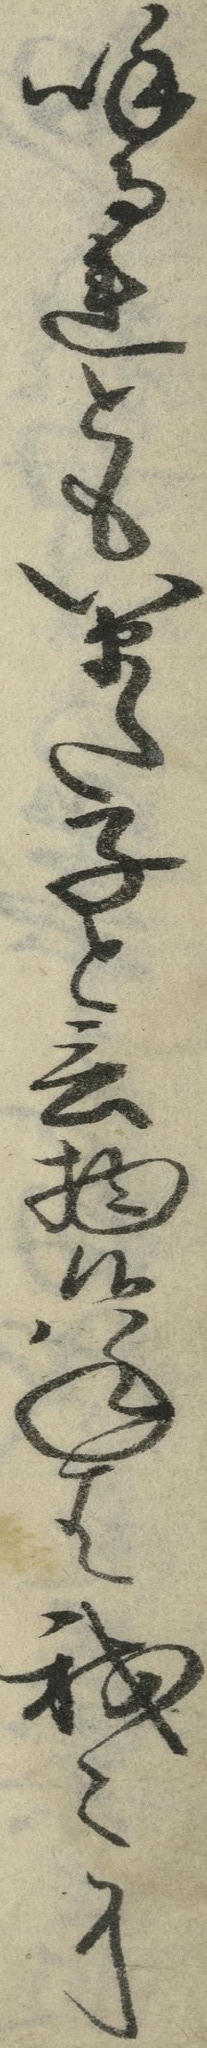呼るれともいまた子と言物候はねは我ゝに
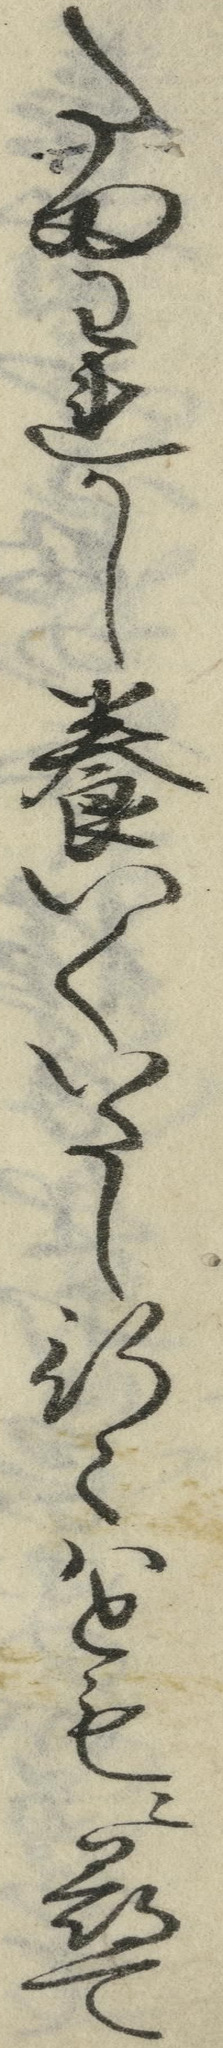たまわれかし養いくいたし行ゝハともニ尋て
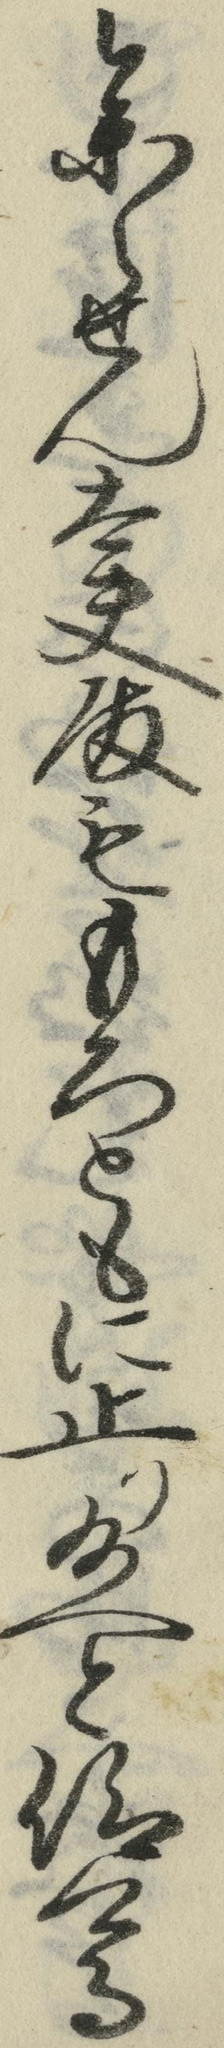参らせん太夫殿ももろともに止リ給へと仰ける
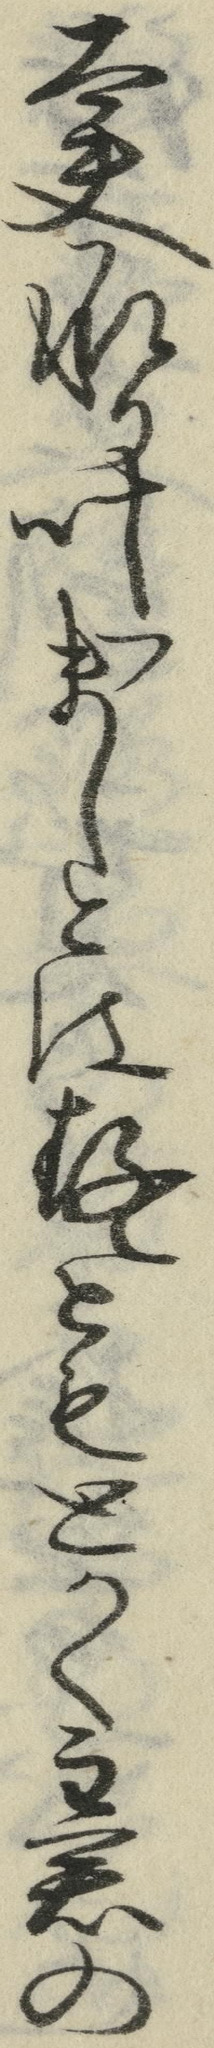太夫承リ叶うましとは存候ともとかく主君の
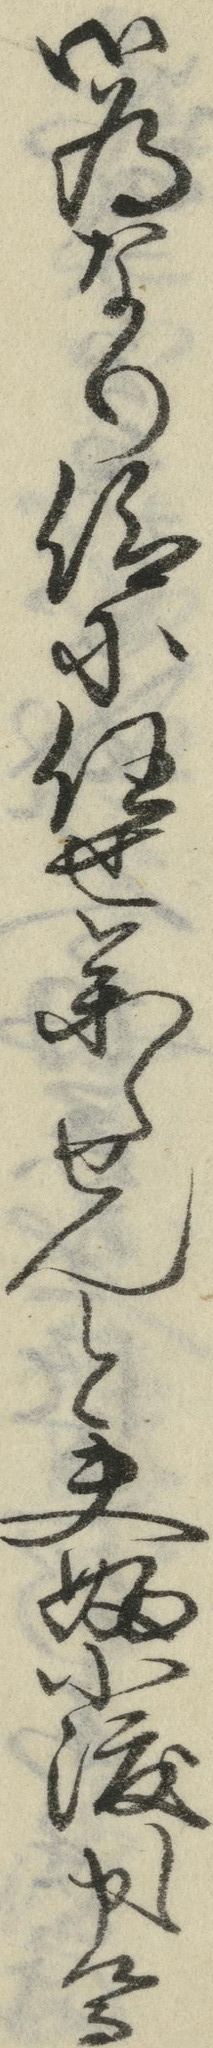御為なり仰に任せ参らせんと夫婦に渡し申ける
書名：浅間記
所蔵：東京大学地震研究所図書室 Earthquake Research Institute Library, The University of Tokyo, JAPAN
